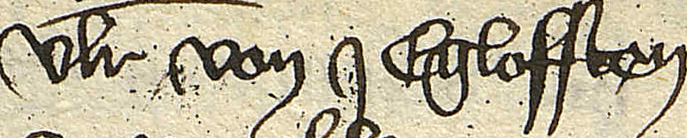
Vlr* von I Eglofſten
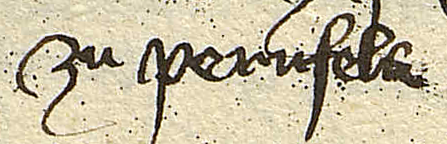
cʒu Pernfels
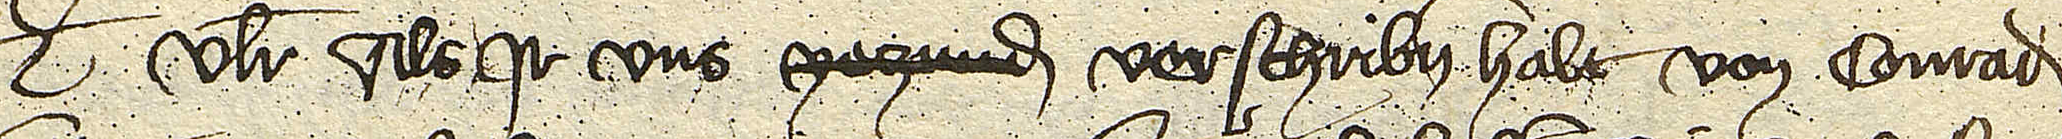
L* Vlr* Als Ir vns yecʒund* verſchribn* habt von Conrad*
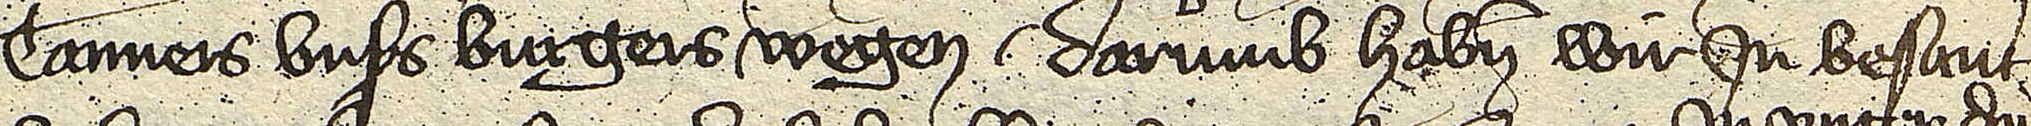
Tanners vnſ*s burgers wegen / Darümb habn* wir In beſant
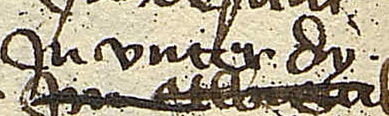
In vnter dy
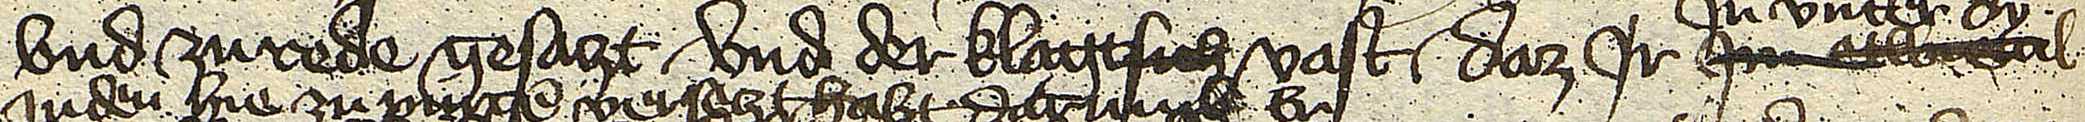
vnd cʒu rede geſacʒt / vnd der klagt ſich vaſt / daʒ Ir Im etwieuil
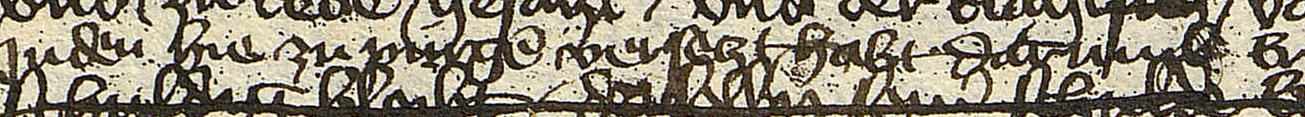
In den hie cʒu pürge* verſecʒt habt darumb Er
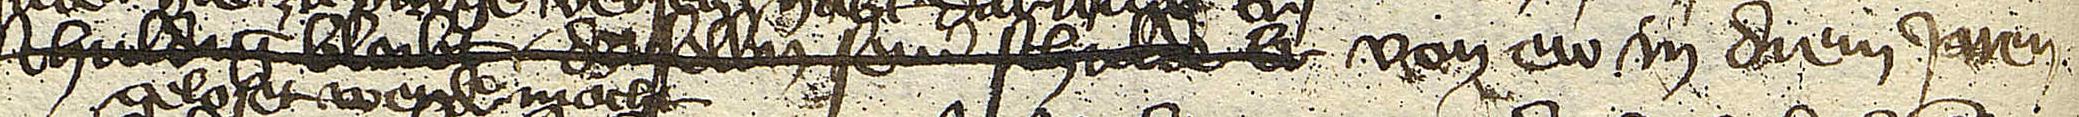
ſchuldig blaibt / derſelbn ſein* ſchulde Er von ew in drein Iaren
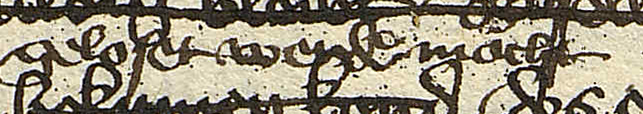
geloſet werd*möcht
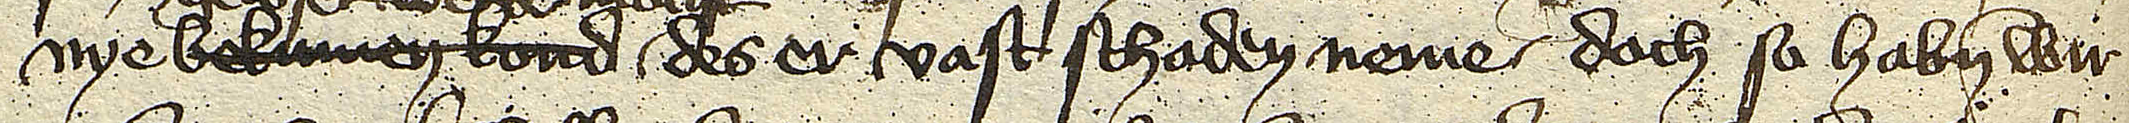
nye bekumen kond / des er vaſt ſchaden neme / doch ſo habn* wir
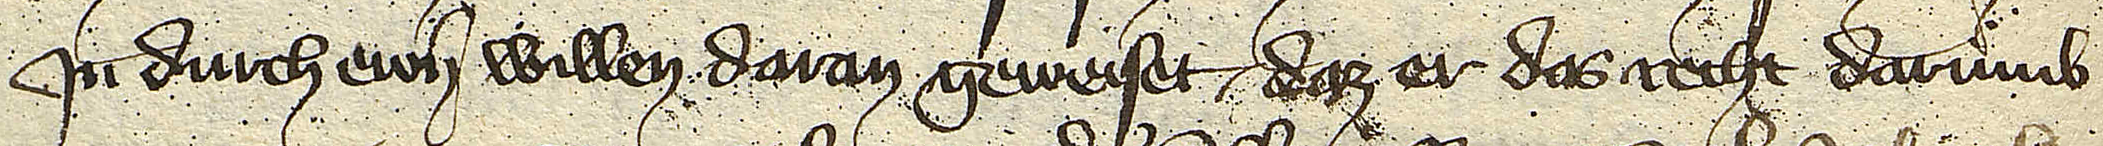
In durch ewn* willen daran geweiſet / daʒ er das recht darümb
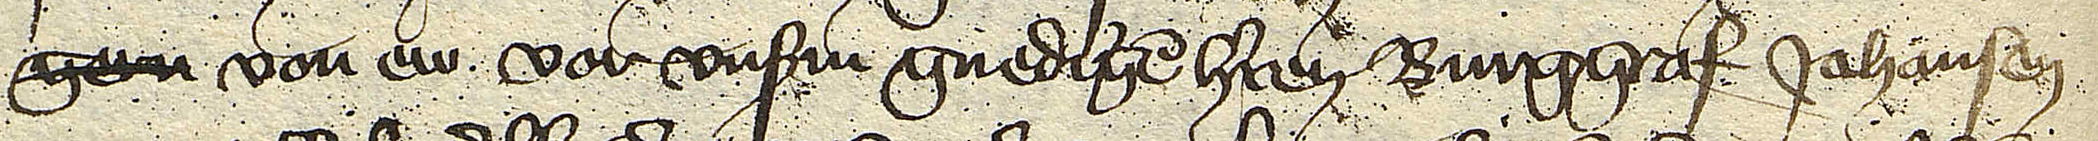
gern von ew vor vnſ*m gnedige* hr*en Burggraf Iohanſen
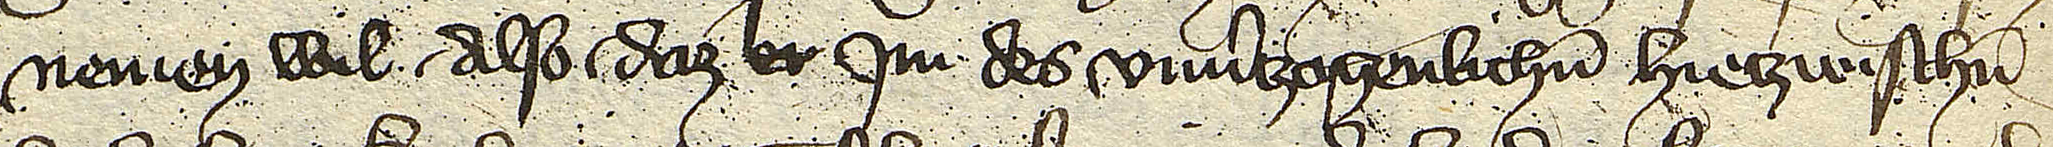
nennen wil / Alſo / daʒ er Im des vnu*cʒogenlichn* hiecʒwiſchn*
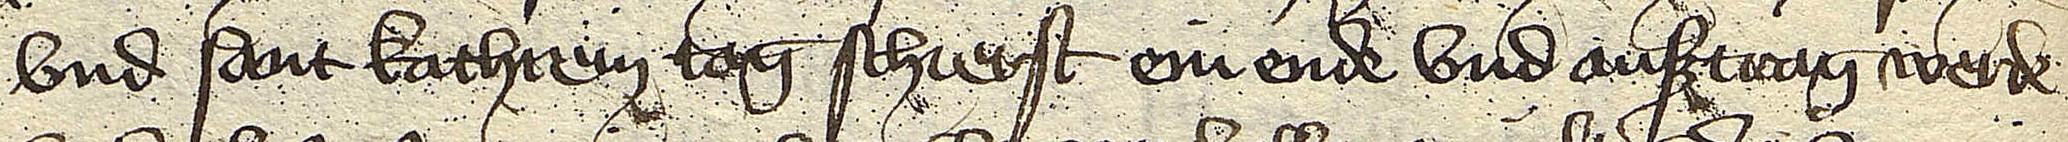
vnd ſant kathrein tag ſchierſt ein ende vns auſʒtrag werde
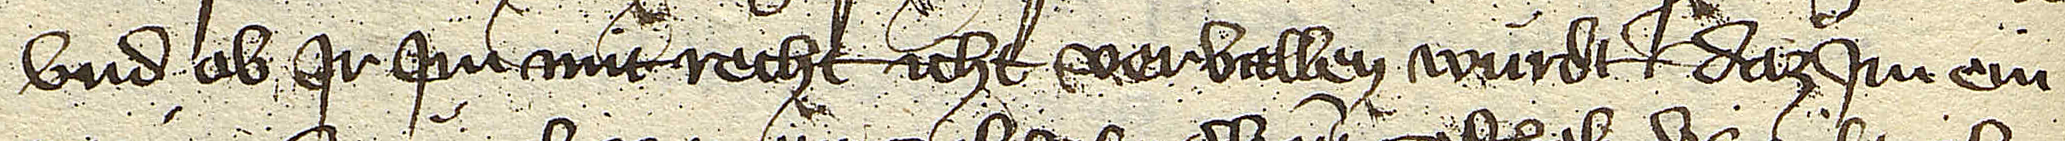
vnd ob Ir Im mit recht icht vervallen würdt / daʒ Im ein
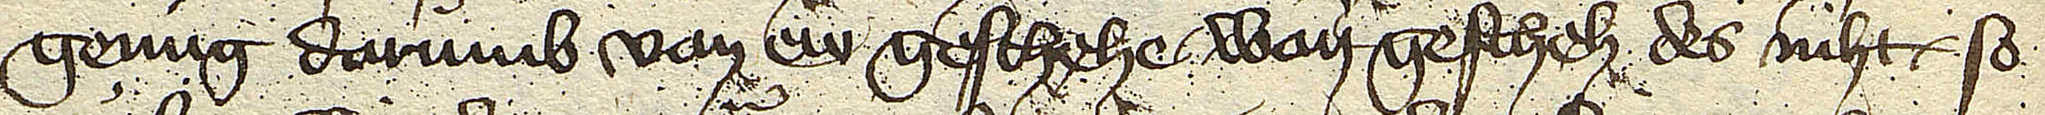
genüg darümb von ew geſchehe / wan* geſcheh des niht / ſo
